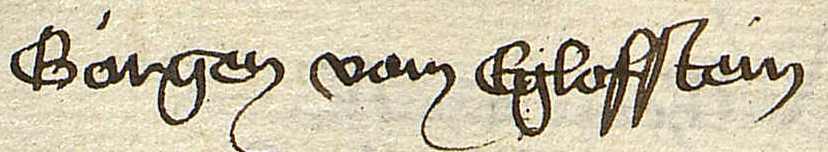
Görgen vom Eglofſtein
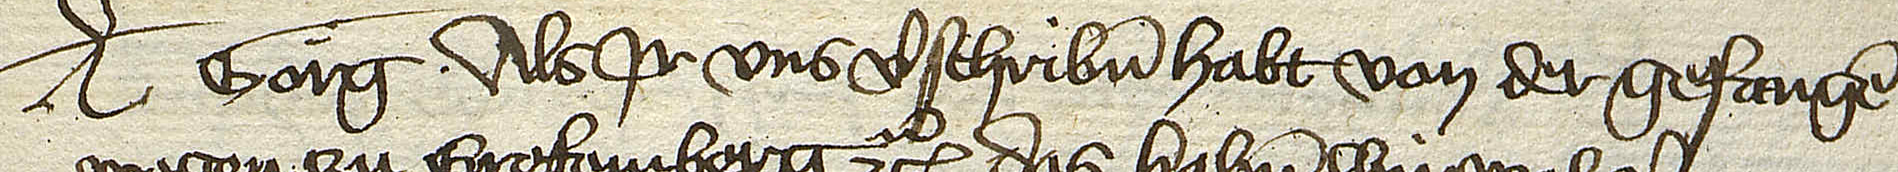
L* Görg . Als Ir vns v*ſchrib*n habt von der gefange*
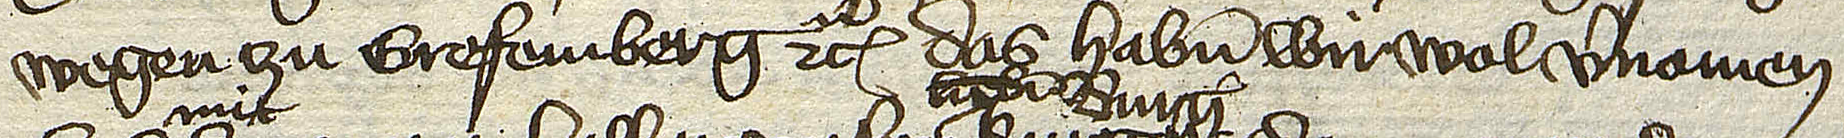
wegen cʒu Grefemberg ec* das hab*n wir wol v*nomen
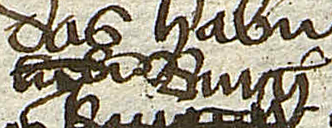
liebn* Burg*
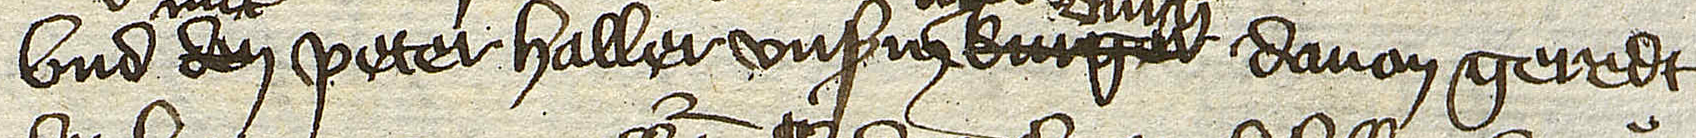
vnd den peter haller vnſ*m burger / dauon geredt .
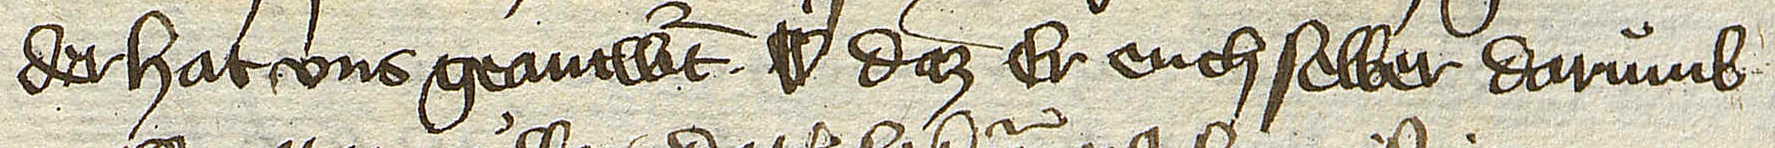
der hat vns geantw*t . % daʒ Er euch ſelber darümb
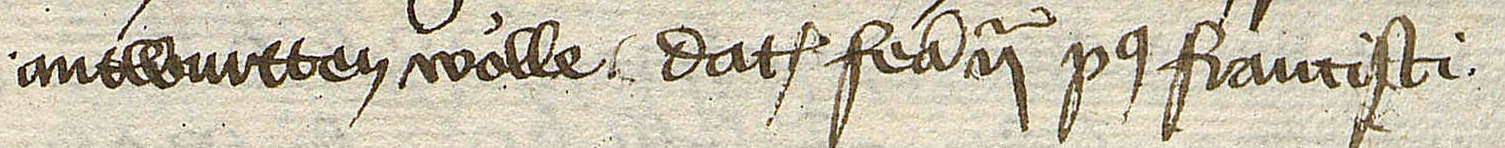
antwurtten wölle / Dat* fea* ii* p* franciſci .
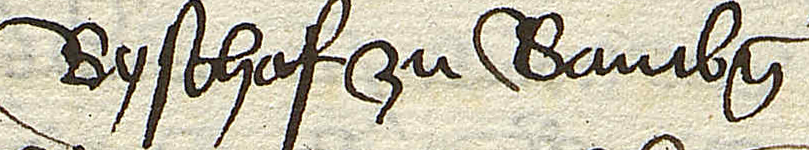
Byſchof cʒu Bamb*g
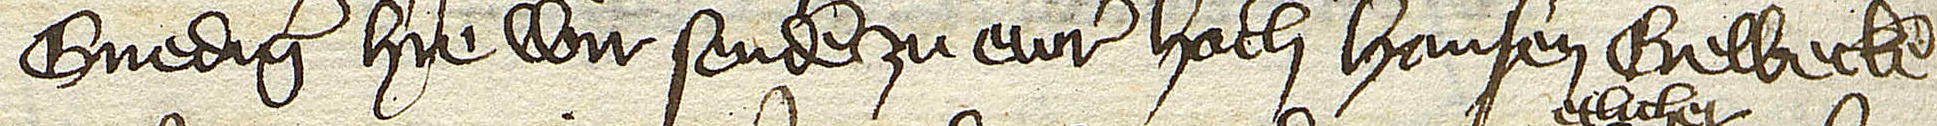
Gnedig* h*re wir ſend* cʒu ewr* hoch* hanſen Erelbecke*
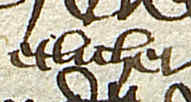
etlicher
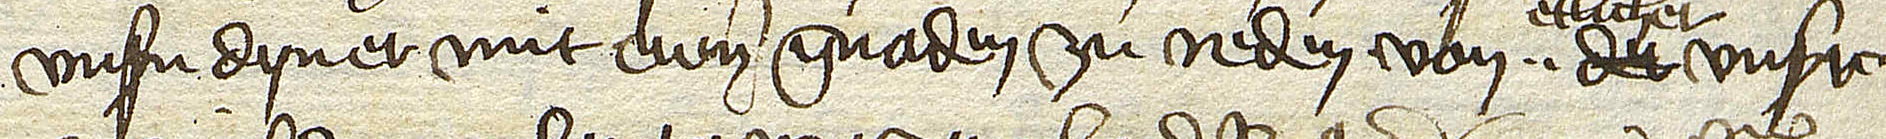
vnſ*n dyner mit ew*n gnaden cʒu reden von ~ der vnſ*r
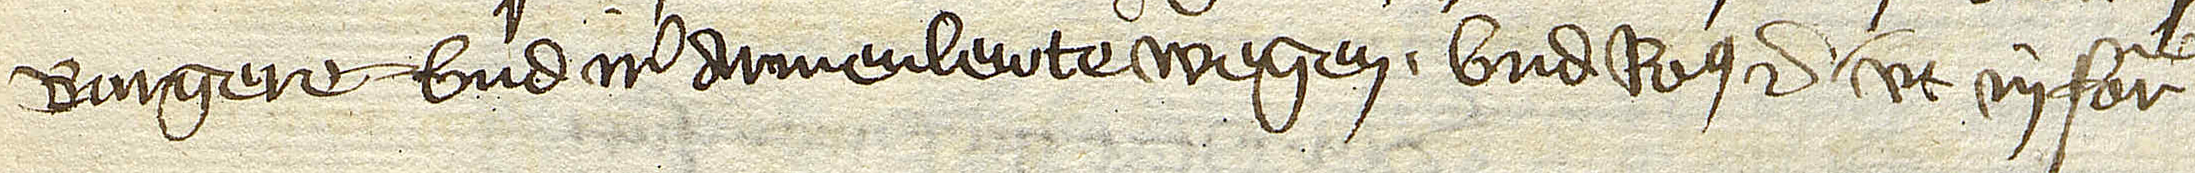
Burgere vnd ir* Armenlewte wegen . vnd Ro* ec* vt* in for*
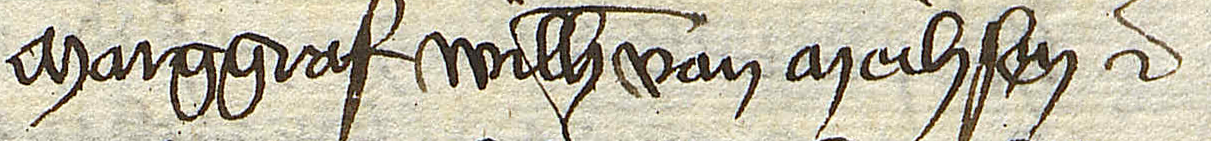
Marggraf wilh* von Meihſen ec*
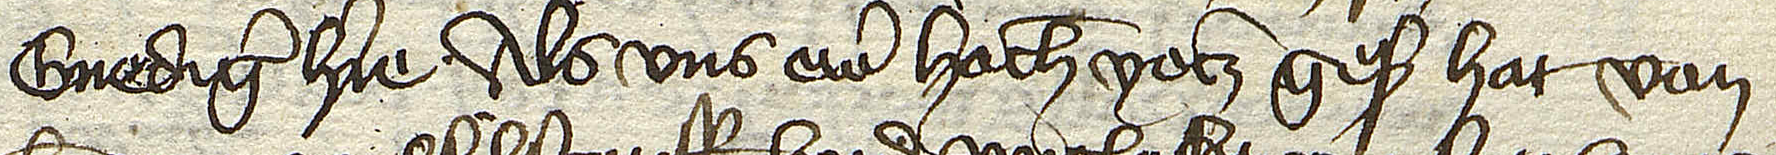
Gnedig* hr*e . Als vns ew* hoch* yecʒ* geſ* hat von
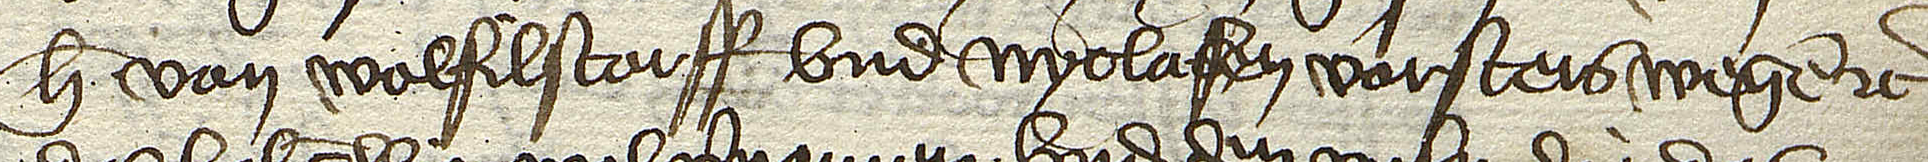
h* von wolfilſtorff vnd Nyclaſen vorſters wege* ec*
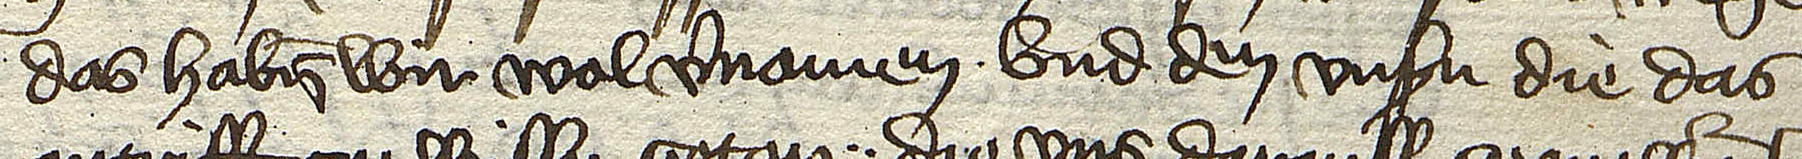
das hab*n wir wol v*nomen . vnd den vnſ*n die das
